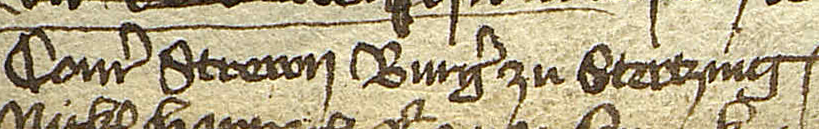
Conr* Strewn Burg* ʒu Stercʒing*
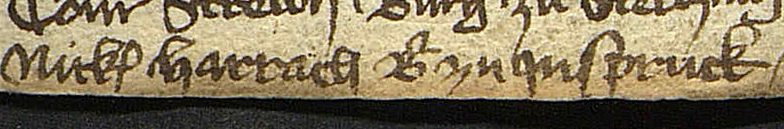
Nick* harrach B* ʒu Inſpruck /
